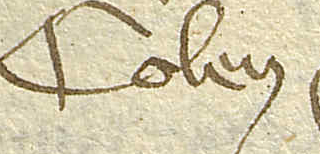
Cölen
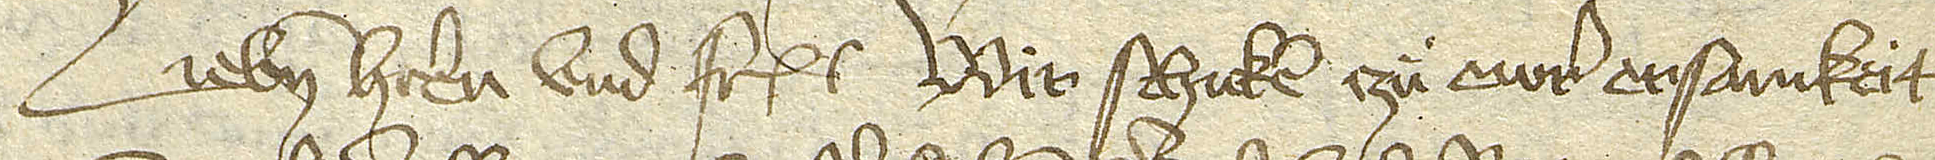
Liebn* hr*en vnd fr* / Wir ſchicke* cʒü ewr* erſamkeit
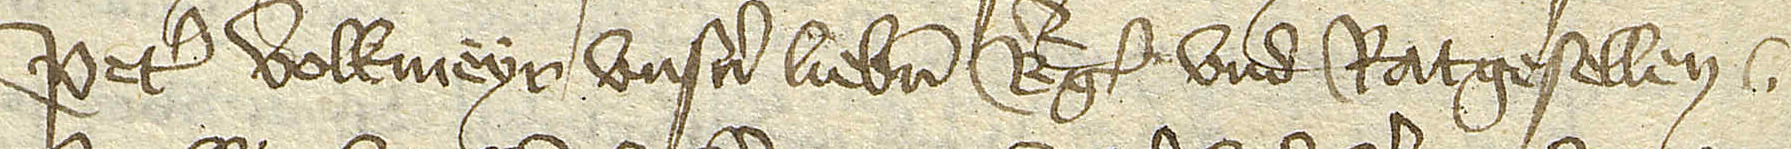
Pet* volkmeyr vnſn* liebn* B*g* vnd Ratgeſellen / .
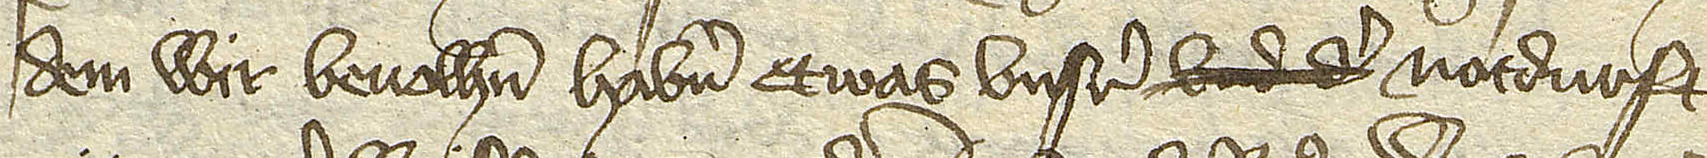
dem wir beuolhn* habn* etwas vnſr* vnd d* notdurft
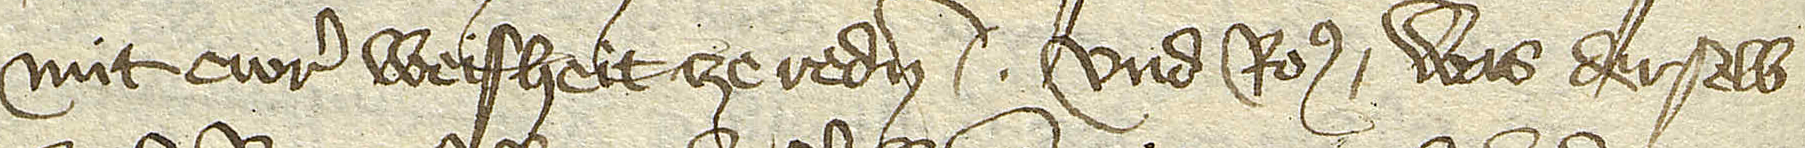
mit ewr* weiſheit cʒe redn* / . vnd Ro* / Was derſelb
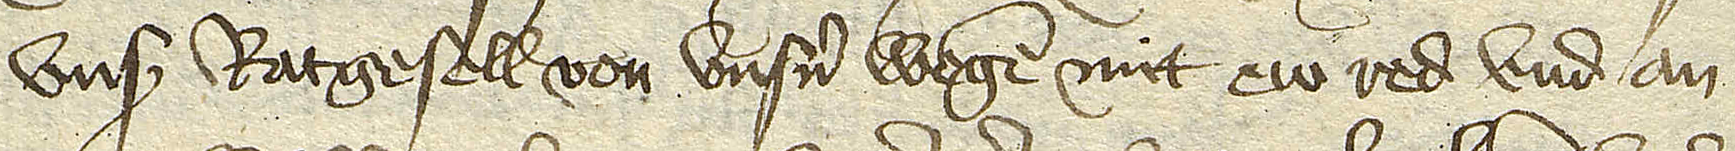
vnſ* Ratgeſell von vnſn* wege* mit ew red vnd an
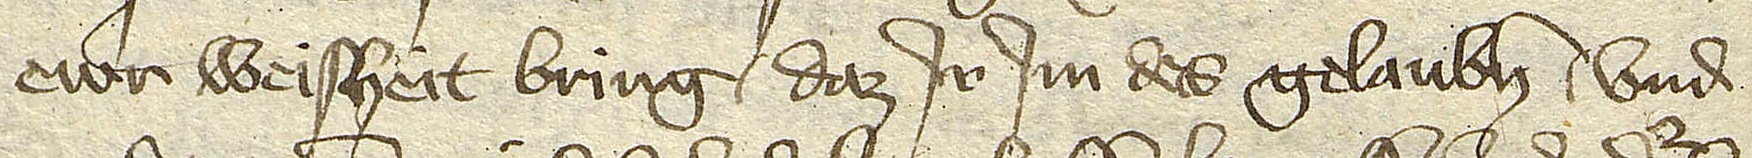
ewr weiſheit bring / daʒ Ir Im des gelaubn* / vnd
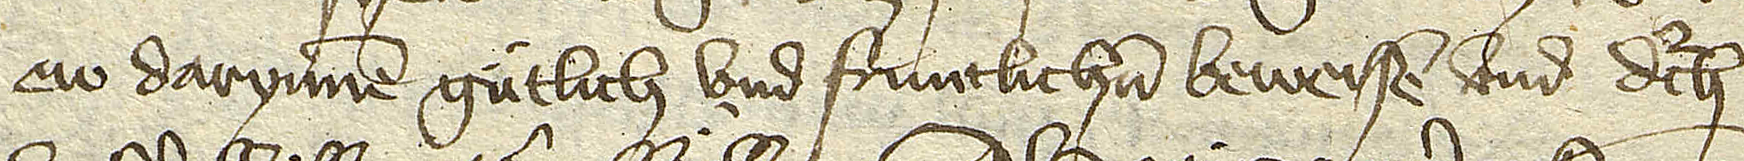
ew darynne* gütlich vnd fruntlichn* beweiſe* vnd d*ch
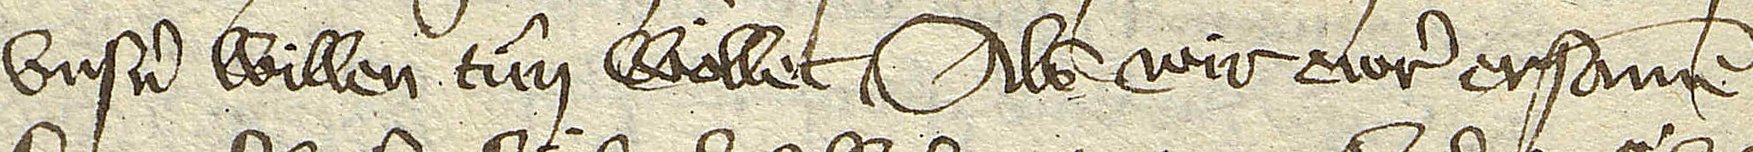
vnſn* willen tün wöllet / Als wir ewr* erſame*
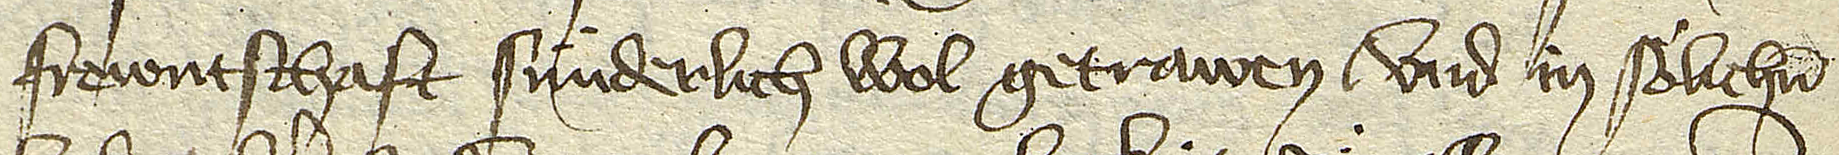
frewntſchaft ſünderlich wol getrawen / vnd in ſölichn*
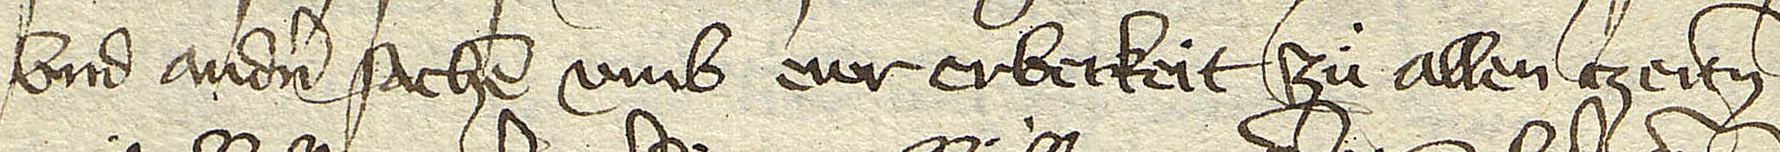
vnd andn* ſache* vmb ewr erberkeit cʒü allen cʒeitn*
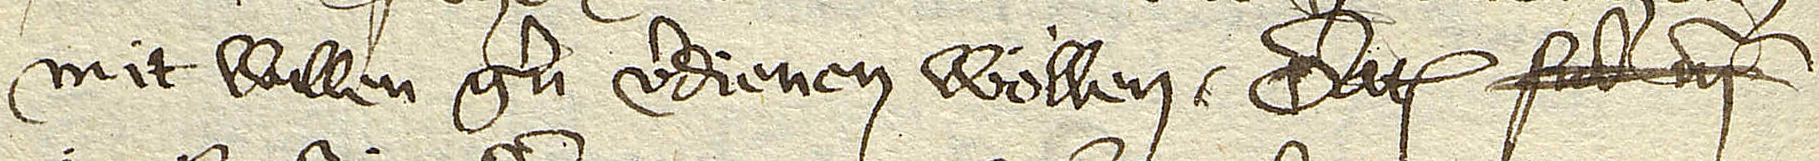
mit willen g*n v*dienen wöllen / Dat* fia* iii*
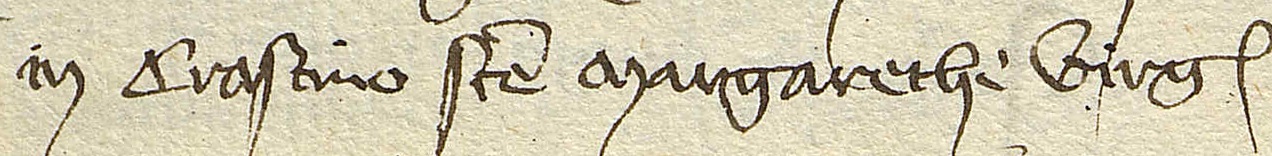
in Craſtino ſce* Margarethe virg*
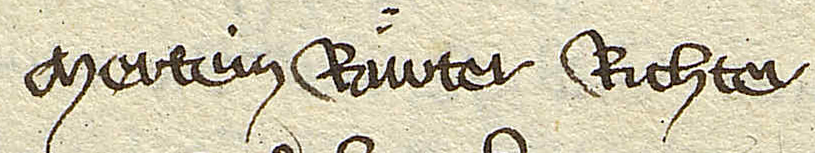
Mertein Räwter Richter
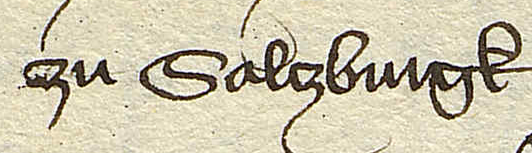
cʒu Salcʒburgk
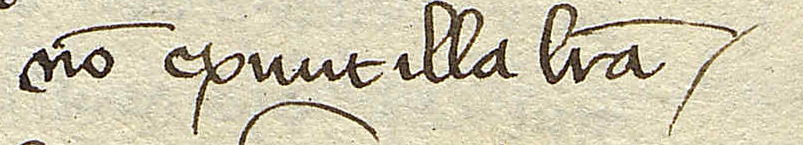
no* exunt illa lra* /
